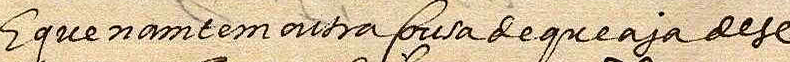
E que nam tem outra Cousa de que aja dese
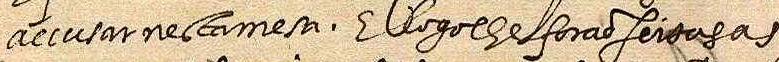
accusar nesta mesa. E logo lhe foraõ feitas as
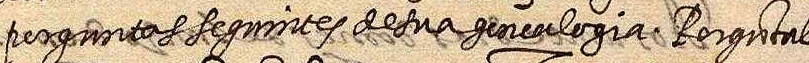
perguntas seguintes de sua genealogia. Pergūtad
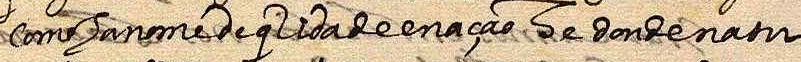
como ha nome de q̄ idade e nação he donde natu
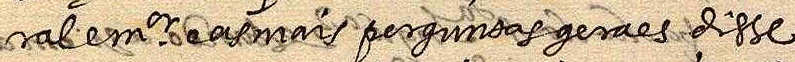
ral e m.or e as mais perguntas geraes disse
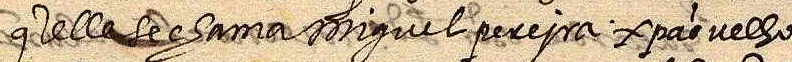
q̄ elle se chama miguel perejra xpão velho
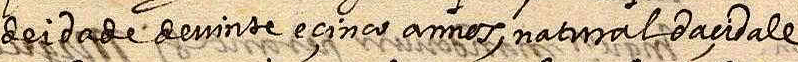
de idade de vinte e çinco annos, natural da çidade
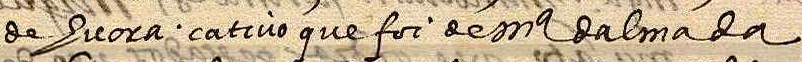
de Evora. cativo que foi de ma dalmada
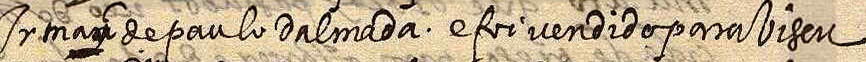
Jrmã de paulo dalmada. e foi vendido para Viseu
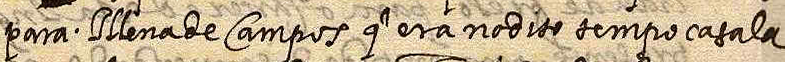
para. Jllena de Campos q̄ era no dito tempo casada
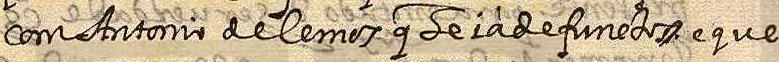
com Antonio de lemos q̄ he ia defunctos e que
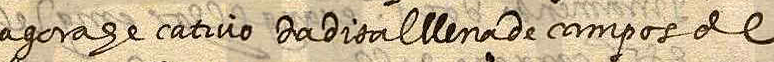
agora he cativo da dita Ellena de campos de
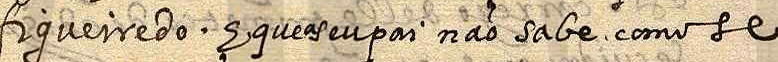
figueiredo. E que o seu pai naõ sabe como se
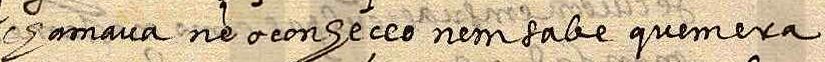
chamava nē o conheçeo nem sabe quem era
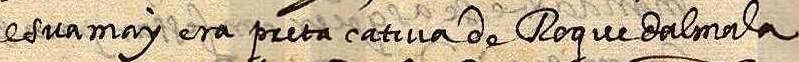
e sua may era preta cativa de Roque dalmada
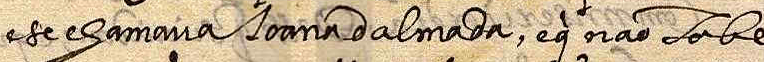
e se chamava Joana dalmada, e q̄ não sabe
